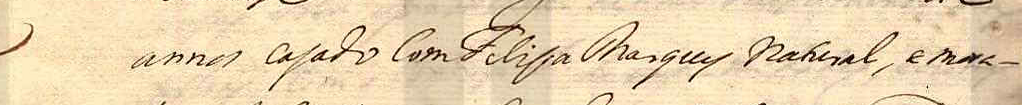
annos casado com Felipa Marques natural, e mora
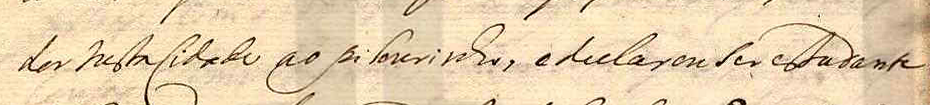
dor nesta Cidade ao pilourinho, e declarou ser estudante
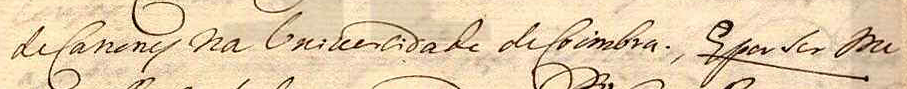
de Canones na Uniuercidade de Coimbra, E por ser me
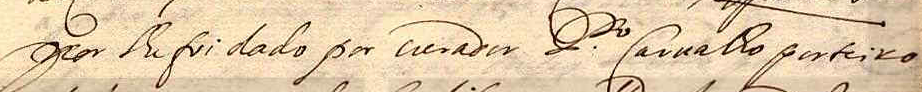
nor lhe foi dado por curador P.ro Carualho porteiro
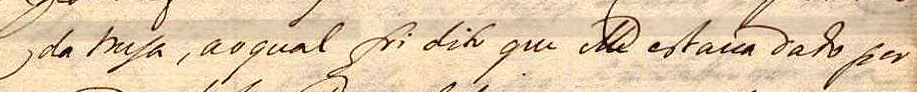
da mesa, ao qual foi dito que elle estaua dado per
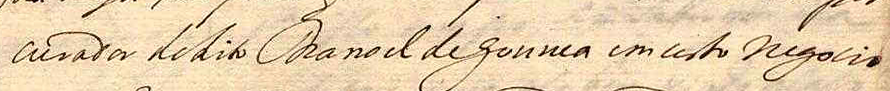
curador do dito Manoel de Gouuea em certo negocio
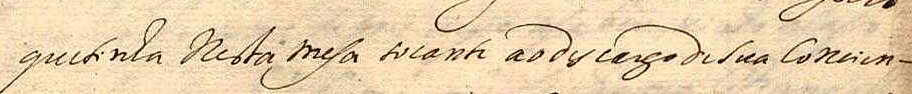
que tinha nesta mesa tocante ao descargo de sua concien
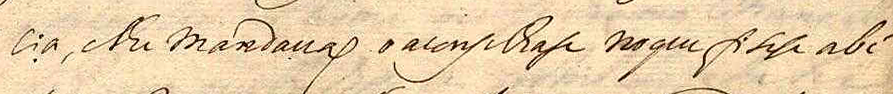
cia, e lhe mandauaõ o aconselhase no que fisese a bē
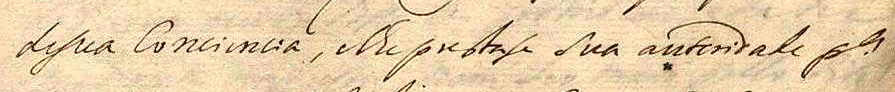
de sua conciencia, e lhe prestase sua autoridade p.a
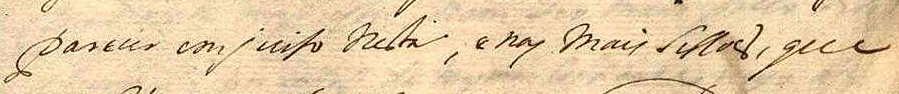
parecer em juiso nesta, e nas mais sessoes, que
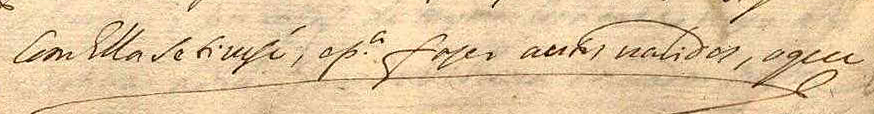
com Ella se tiuesē, e p.a faser autos ualidos, o que
